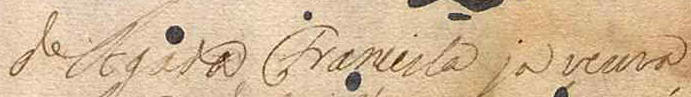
de Agada Francisca ja veuva,
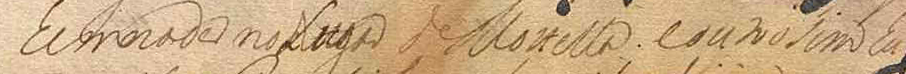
he morador no lugar de Mortella; e outrosim hū
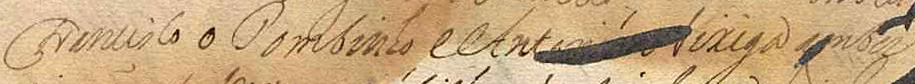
Francisco o Pombinho, e Anton_ bixiga ambos
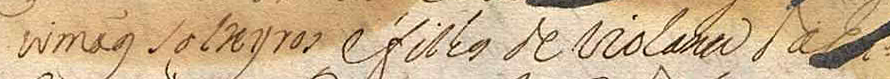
irmaõs solteyros e filhos de violante da E_
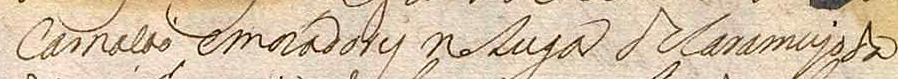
Carnaçaõ, e moradores no Lugar de Caramujo da
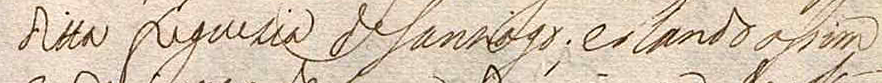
ditta freguezia de Santiago; estando assim
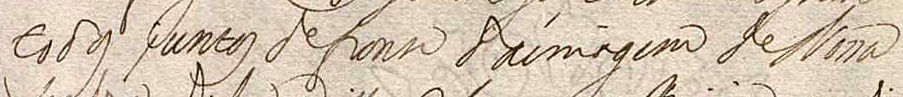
todos juntos defronte da imagem de Nossa
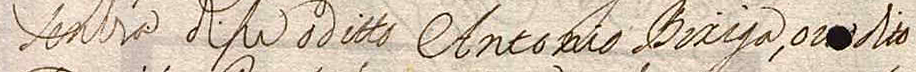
senhora disse o ditto Antonio Bixiga, ou_ dito
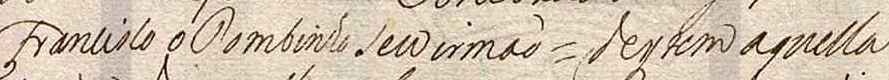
Francisco o Pombinho seu irmaõ = deytem aquella
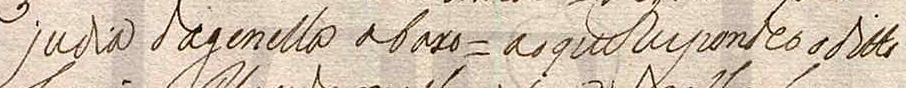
judia da genella abaxo = ao que Respondeo o ditto
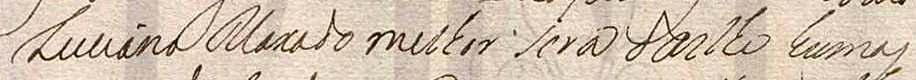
Luciano Maxado melhor sera darlhe humas
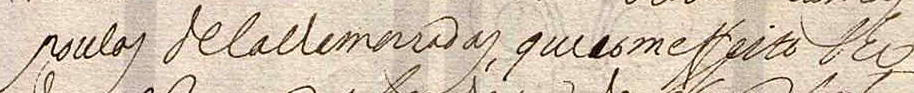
poucas de Cachamorradas, que com effeito lhe
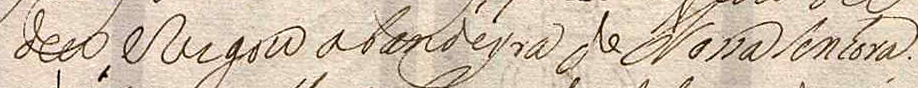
deu, e Rasgou a bandeyra de Nossa Senhora.
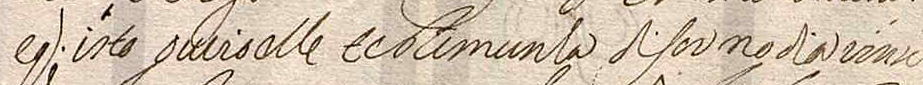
e q̄. isto ouvio elle testemunha diser no dia vinte
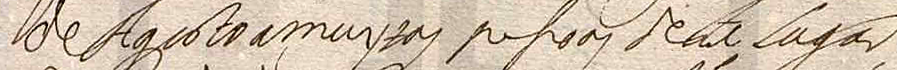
de Agosto a muytas pessoas deste lugar
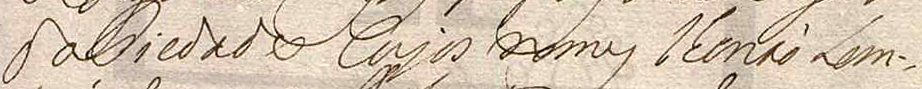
da Piedade Cujos nomes lhe naõ Lem
